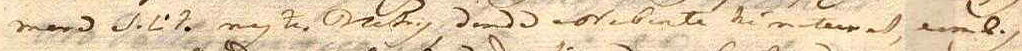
more Solito nesta Matris; donde a nubente hé natural, ambos
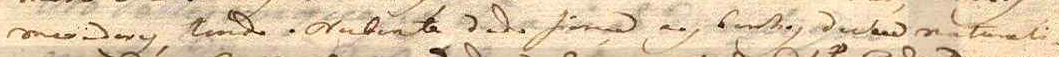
moradores, tendo o Nubente dado fiança aos banhos de seu naturalid
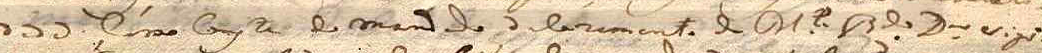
dade Como Consta do mandado de cazamento do M.to R.do D.or vigr.o
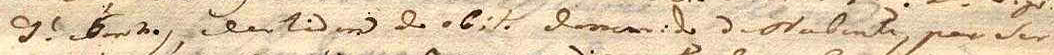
G.l e banhos, e certidam do obito do marido da Nubente, por ser
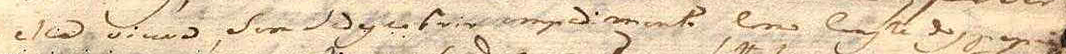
sua viuva, sem se descobrir impedimento, e no Conste dos papeis
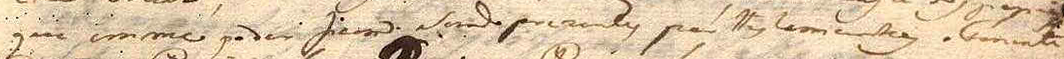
que em meo poder ficam sendo prezentes por testemunhas o Tenente
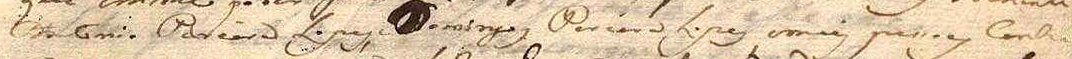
Antonio Pereira Lopes, e Domingos Pereira Lopes e mais pessoas Conhe
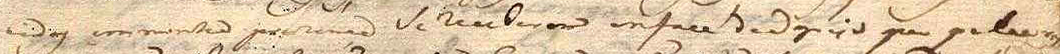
cidos em minha prezença se Receberam en face da Igreja por palavras
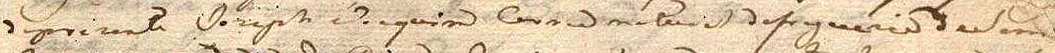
de prezente Iozeph Ioaquim Correa natural da freguezia de Sam
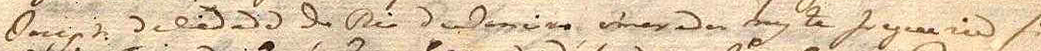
Iozeph da Cidade do Rio de Ianeiro, e morador nesta freguezia fi
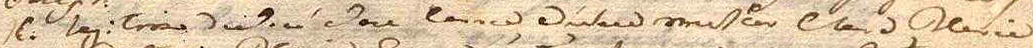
lho legitimo de Ioaõ Ioze Correa e de sua mulher Clara Maria
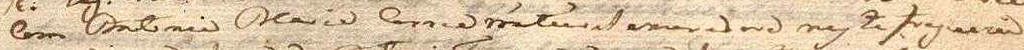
com Antonia Maria Correa natural e moradores nesta freguezia
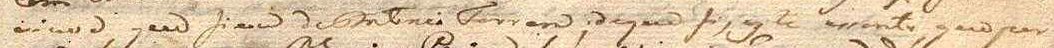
viuva que ficou de Antonio Ferreira; de que fis este assento que por
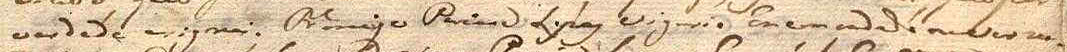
verdade asignei; Francisco Pereira Lopes Vigario em verdade na varzea
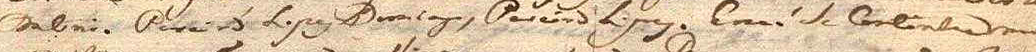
Antonio Pereira Lopes Domingos Pereira Lopes. E naõ se Contem mais
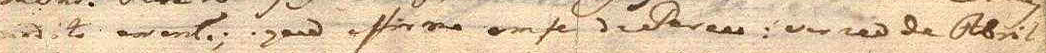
o dito assento; que affirmo em fe de Paroco, varzea de Abril
